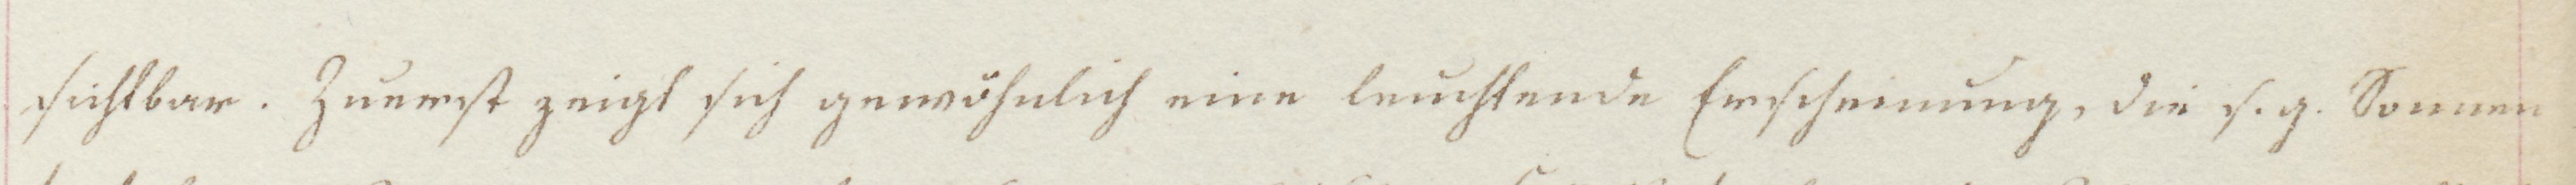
sichtbar. Zuerst zeigt sich gewöhnlich eine leuchtende Erscheinung, die s. g. Sonnen
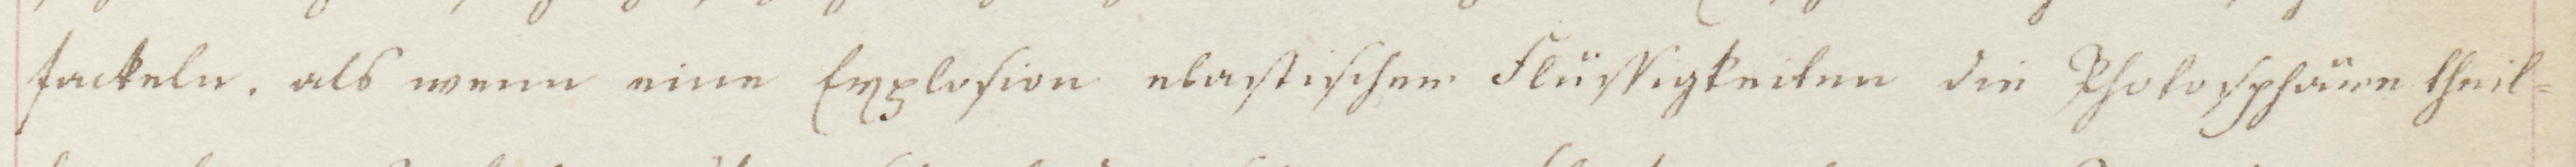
fackeln, als wenn eine Explosion elastischer Flüssigkeiten die Photosphäre theil-
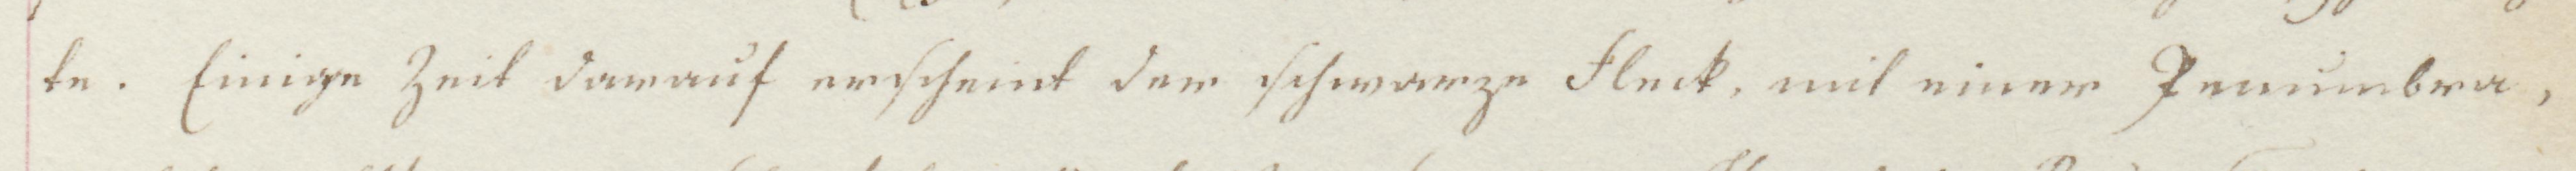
te. Einige Zeit darauf erscheint der schwarze Fleck, mit einer Penumbra,
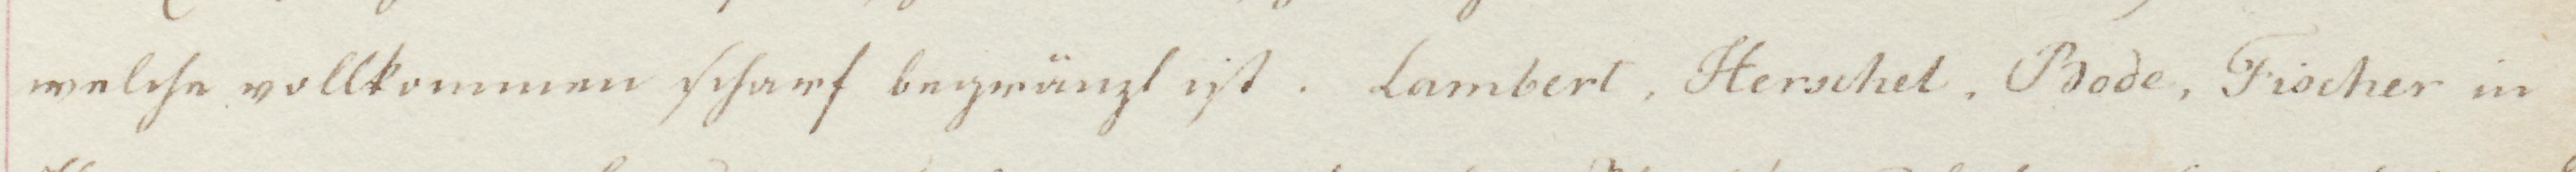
welche vollkommen scharf begränzt ist. Lambert, Herschel, Bode, Fischer in
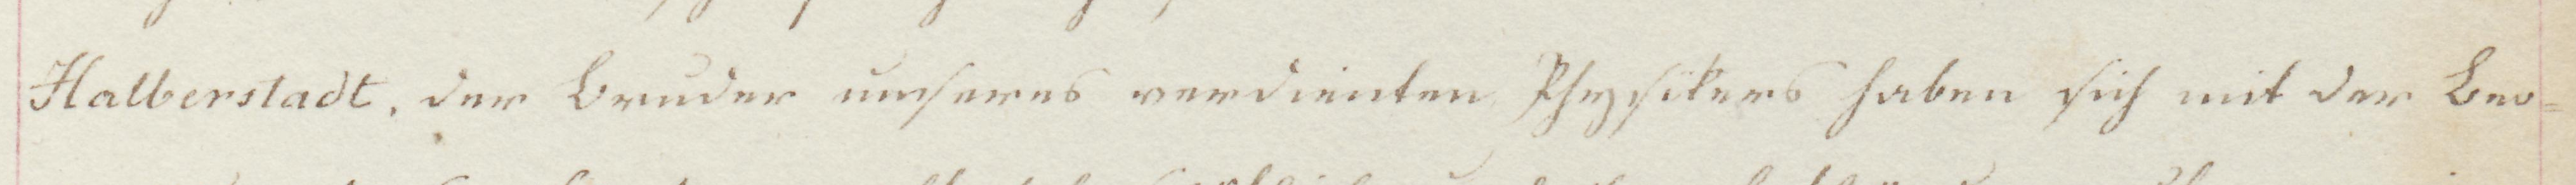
Halberstadt, der Bruder unseres verdienten Physikers haben sich mit der Beo-
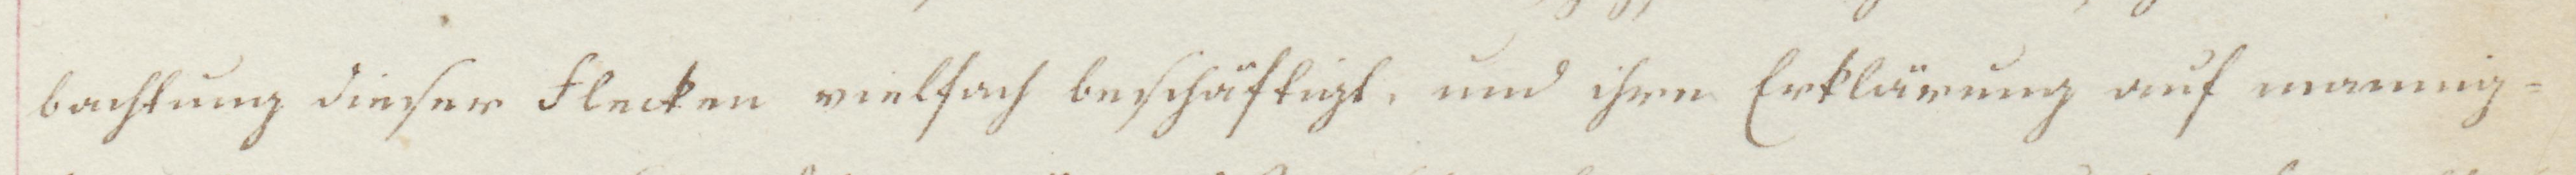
bachtung dieser Flecken vielfach beschäftigt, und ihre Erklärung auf mannig-
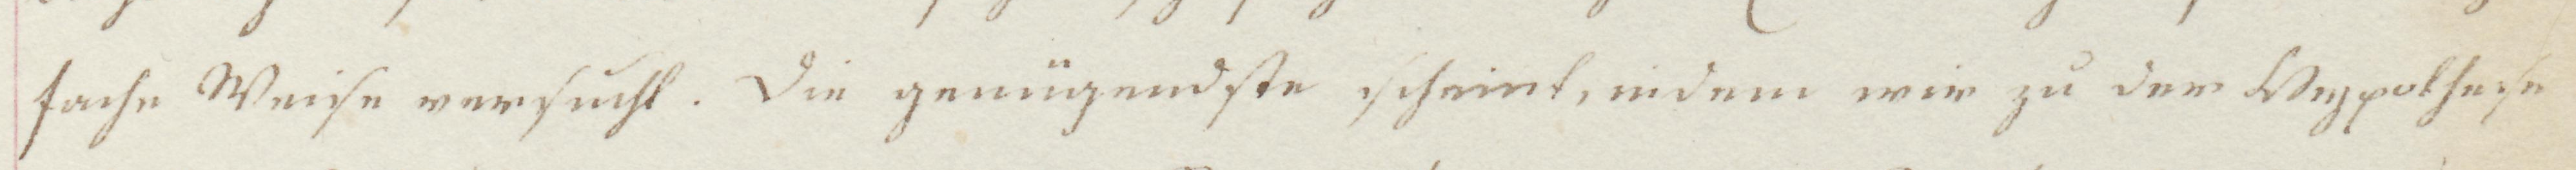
fache Weise versucht. Die genügendste scheint, indem wir zu der Hypothese
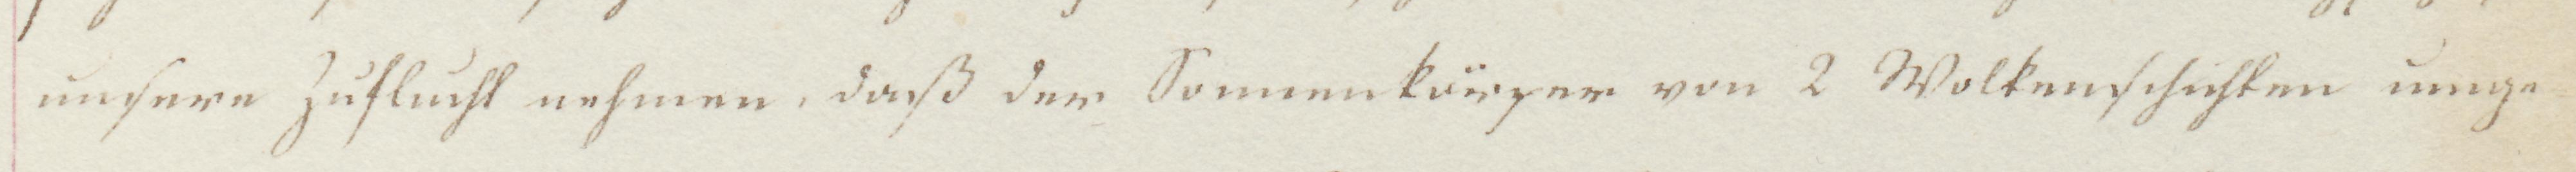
unsere Zuflucht nehmen, daß der Sonnenkörper von 2 Wolkenschichten umge-
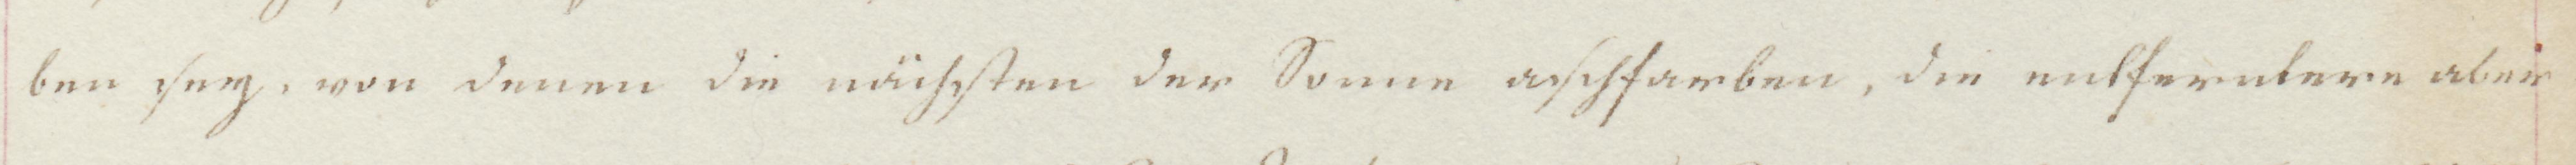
ben sey, von denen die nächsten der Sonne aschfarben, die entferntere aber
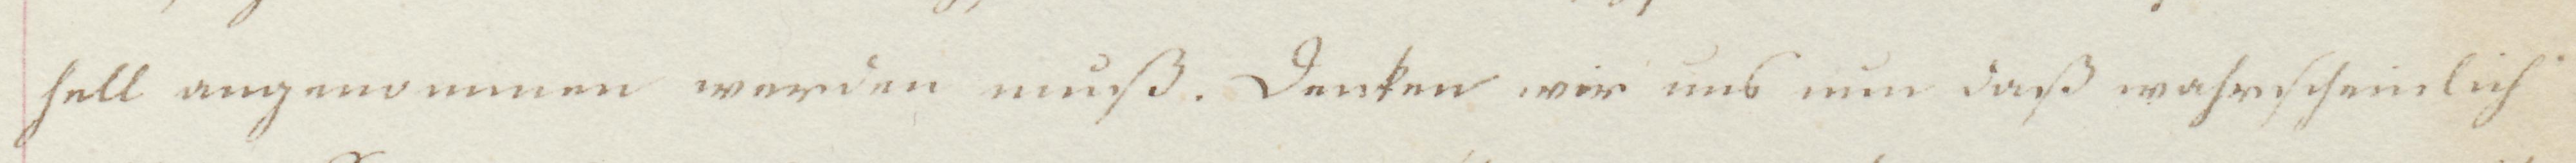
hell angenommen werden muß. Denken wir uns nun, daß wahrscheinlich
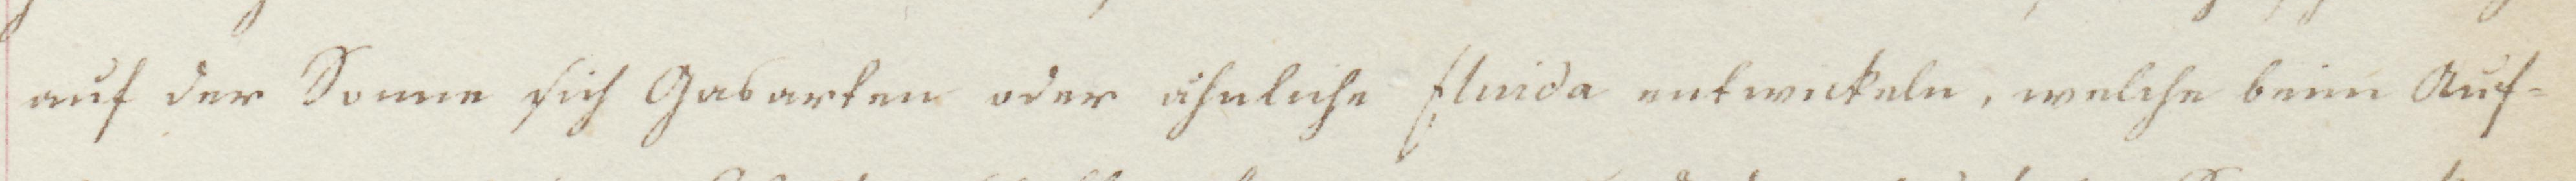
auf der Sonne sich Gasarten oder ähnliche fluida entwickeln, welche beim Auf-
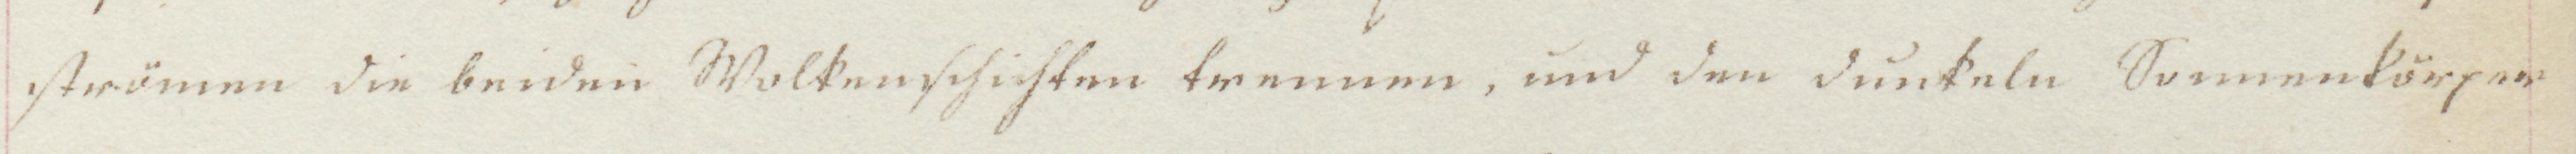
strömen die beiden Wolkenschichten trennen, und den dunkeln Sonnenkörper
